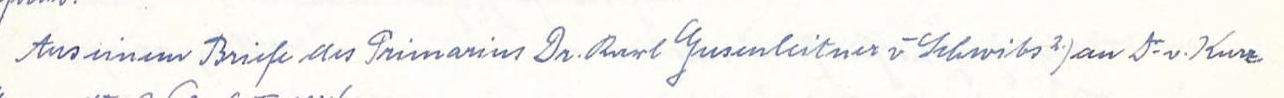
Aus einem Briefe des Primarius Dr. Karl Gusenleitner v/o Schwibs 2)an D. v Kurz
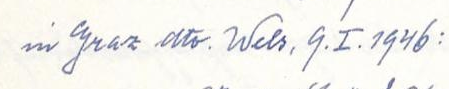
in Graz dto. Wels, 9. I. 1946:
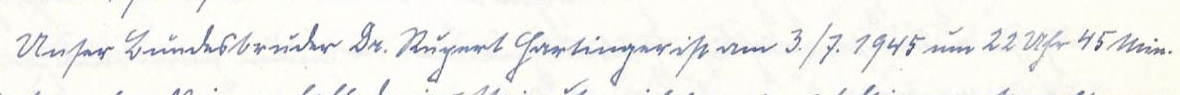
Unser Bundesbruder Dr. Rupert Hartinger ist am 3. /7. 1945 um 22 Uhr 45 Min.
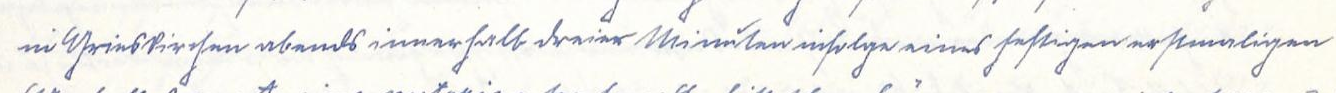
in Grieskirchen abends innerhalb dreier Minuten infolge eines heftigen erstmaligen
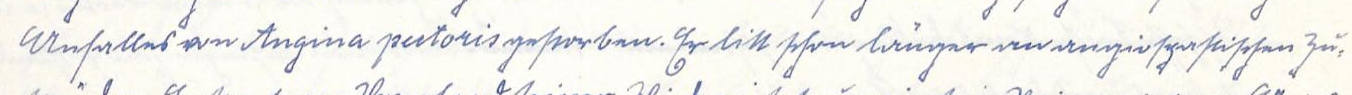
Anfalles von Angina pectoris gestorben. Er lit schon länger an angiospastischen Zu-
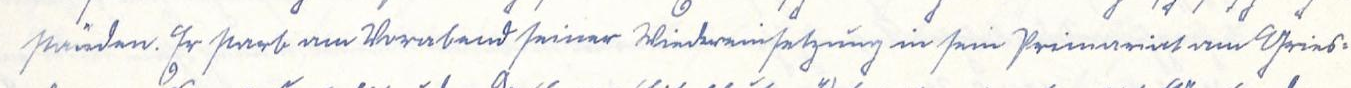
ständen. Er starb am Vorabend seiner Wiedereinsetzung in sein Primariat am Gries-
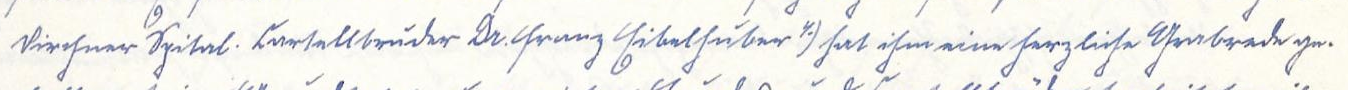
kirchner Spital. Cartelbruder Dr. Franz Eibelhuber 4) hat ihm eine herzliche Grabrede ge-
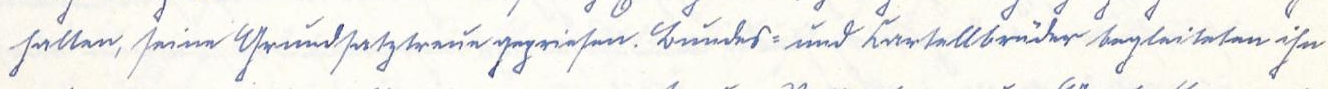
halten, seine Grundsatztreue gepriesen. Bundes- und Cartellbrüder begleiteten ihn
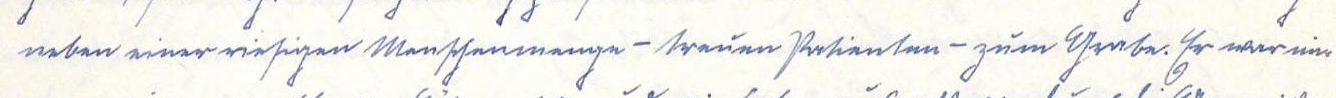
neben einer riesigen Menschenmenge-treuen Patienten- zum Grabe. Er war im-
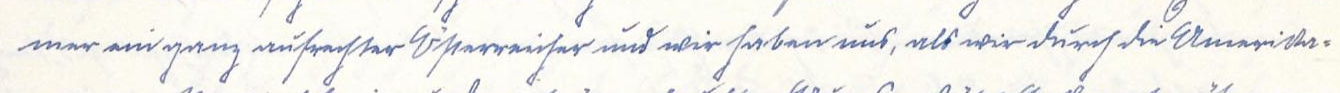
mer ein ganz aufrechter Österreicher und wir haben uns, als wir durch die Amerika-
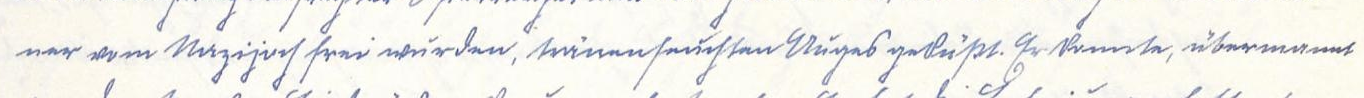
ner vom Nazijoch frei wurden, tränenfeuchten Auges geküßt. Er. konnte, übermannt
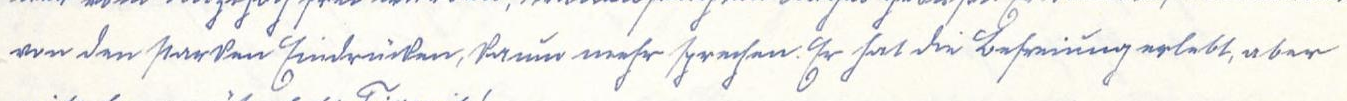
von den starken Eindrücken, kaun mehr sprechen. Er hat die Befreiung erlebt, aber
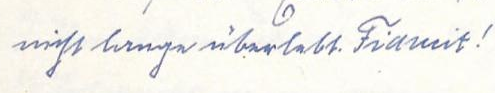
nicht lange überlebt. Fiducit!
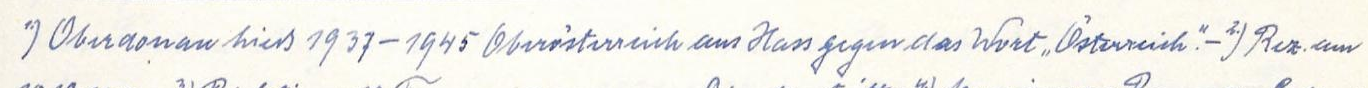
14) Oberdonau hieß 1937-1945 Oberösterreich aus Hass gegen das Wort Österreich“. .) Rez. am
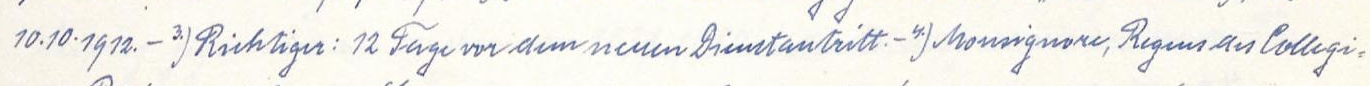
10. 10.1912.- 3) Richtiger: 12 Tage vor dem neuen Dienstantritt. 4) Monsignore, Regens des Collegi-
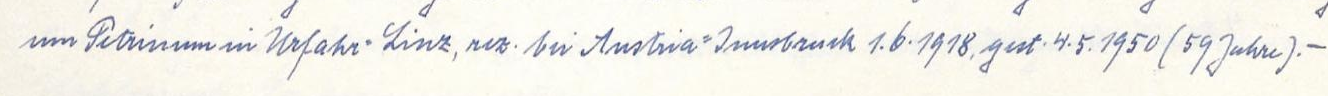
um Petrinum in Urfahr- Linz, rez. bei Austria- Innsbruck 1.6.1918, gest. 4.5. 1950 (59 Jahre ). -
